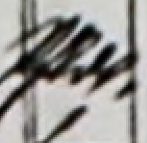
P???
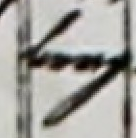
berg
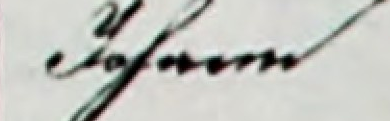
Johann
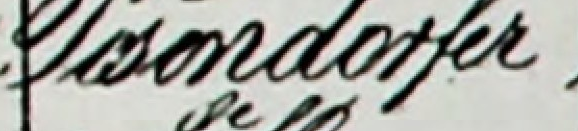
Posondorfer
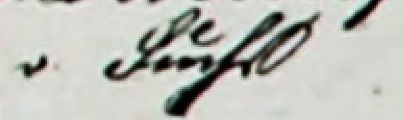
v. Fuchs
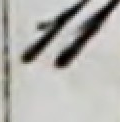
11
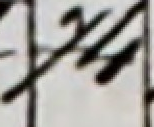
74
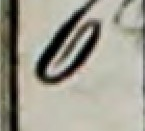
6
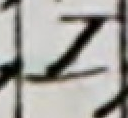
I
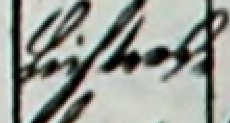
Lichters„
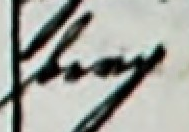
berg
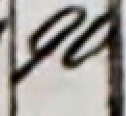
90
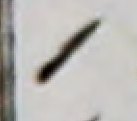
1
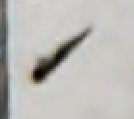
1
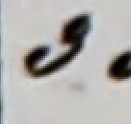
3
